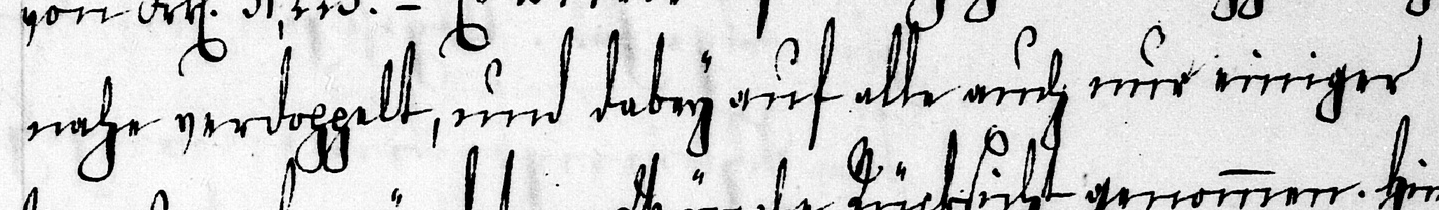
nahe verdoppelt, und dabey auf alle auch nur einiger
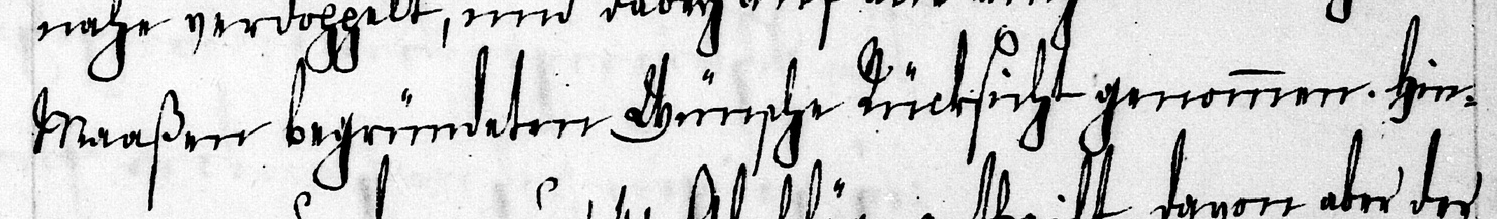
Maaßen begründeten Wünsche Rücksicht genommen. Hin¬
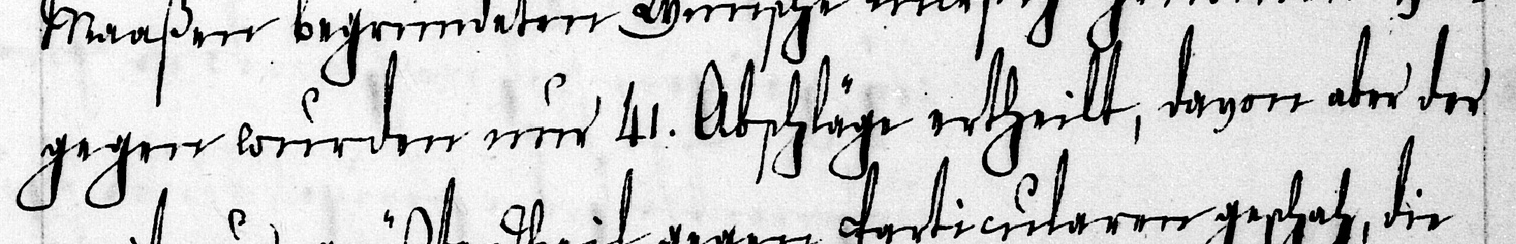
gegen wurden nur 41. Abschläge ertheilt, davon aber der
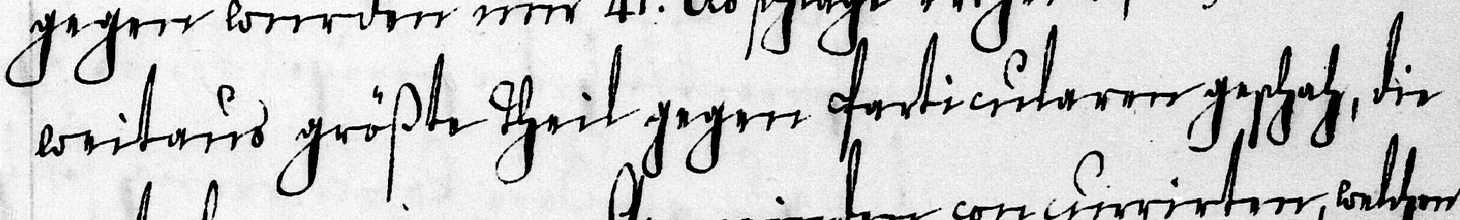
weitaus größte Theil gegen Particularen geschah, die
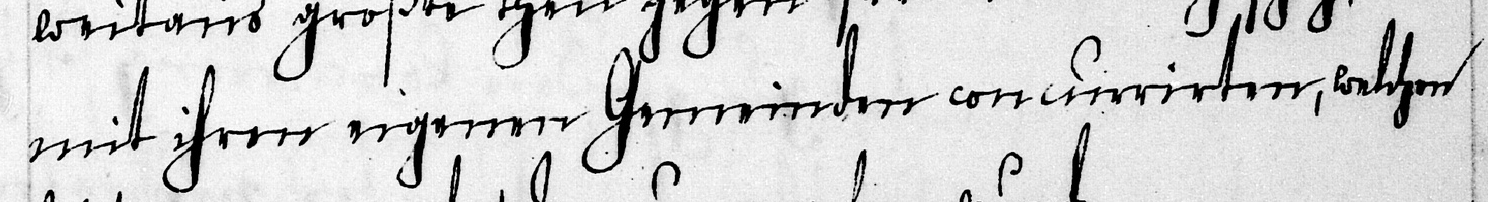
mit ihren eigenen Gemeinden concurrirten, welchen
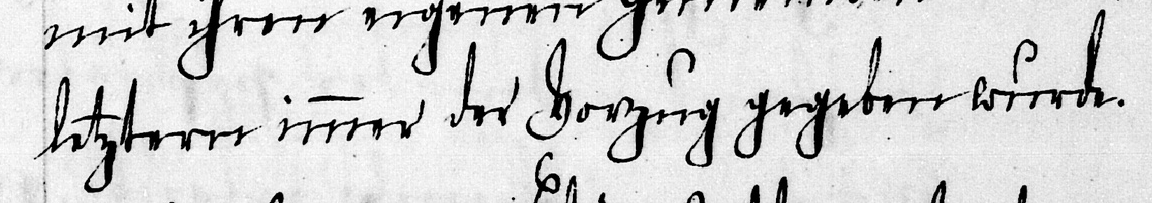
letztern immer der Vorzug gegeben wurde.
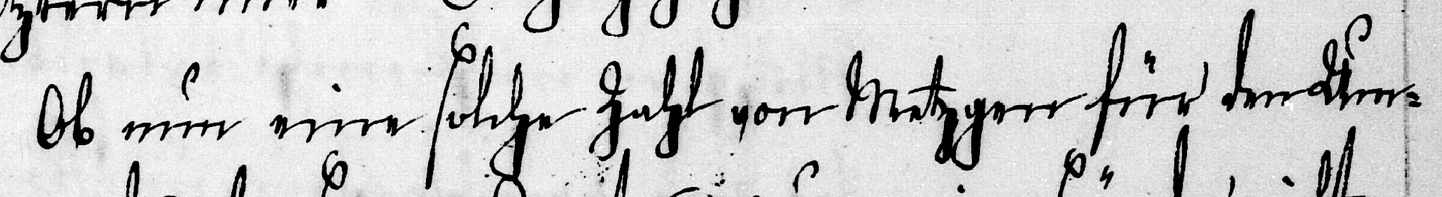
Ob nun eine solche Zahl von Metzgen für den Um¬
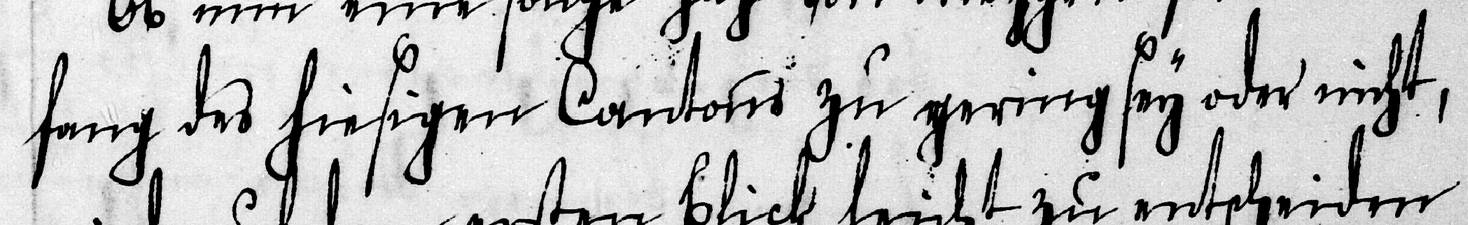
fang des hiesigen Cantons zu gering sey oder nicht,
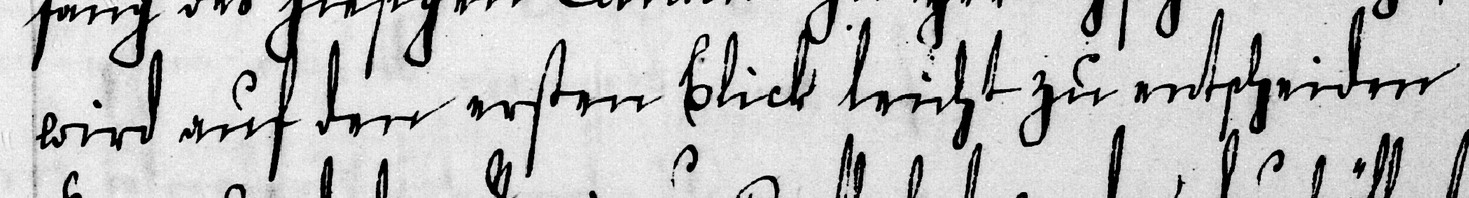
wird auf den ersten Blick leicht zu entscheiden
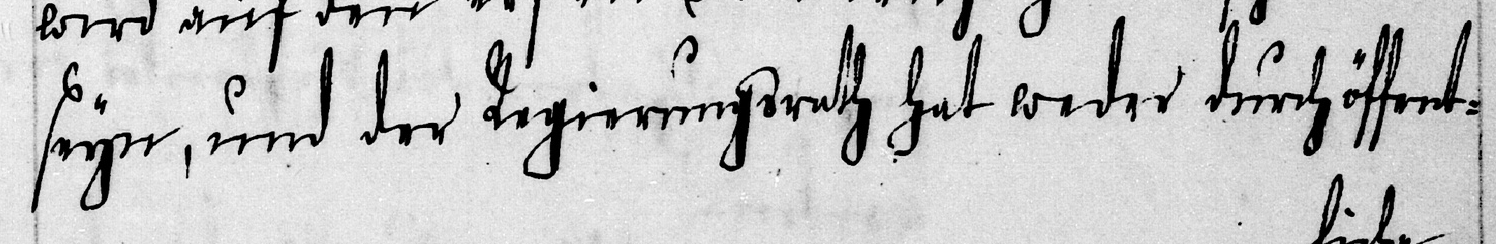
seyn, und der Regierungsrath hat weder durch öffen¬
